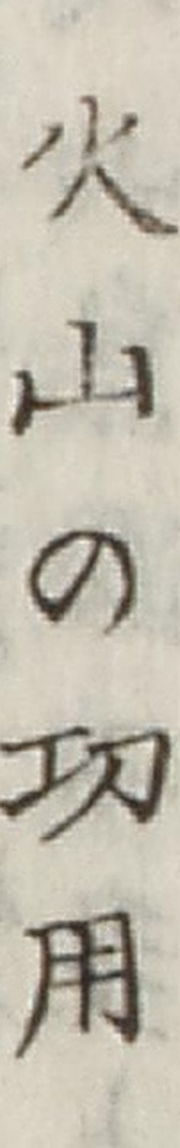火山の功用
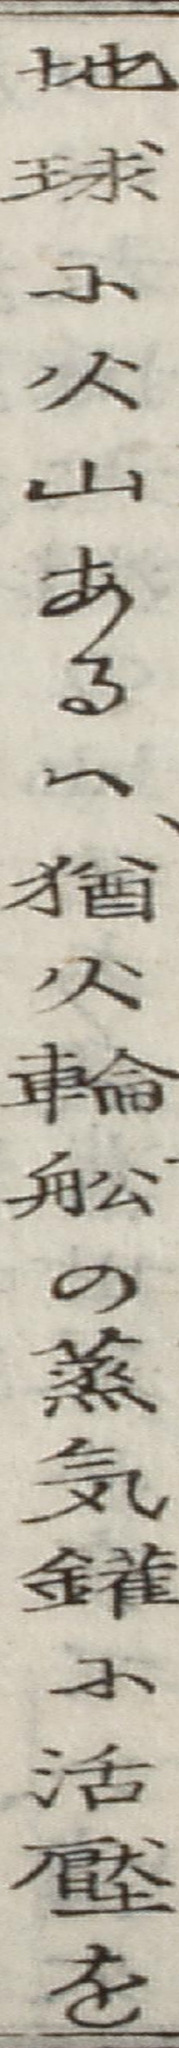地球に火山あるは、猶火輪船の蒸気鑵に活圧を
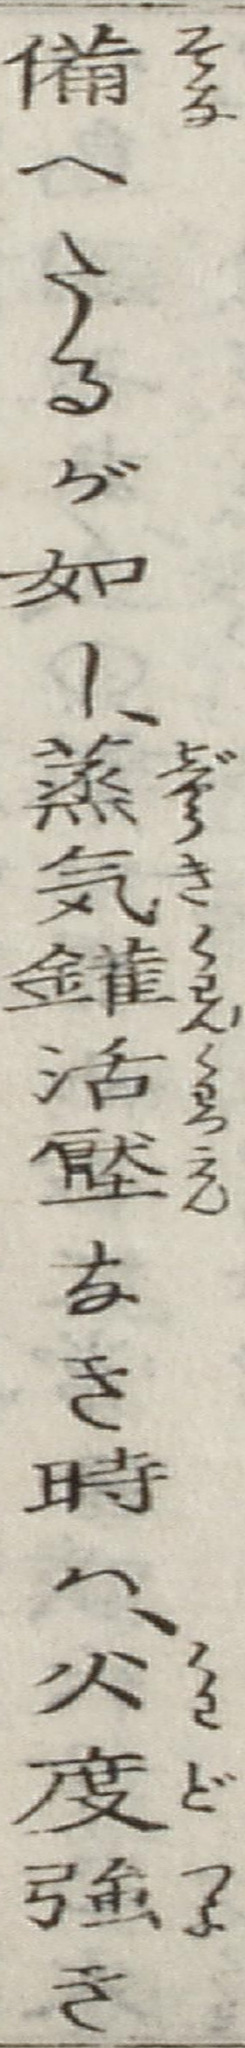備えたるが如し、蒸気鑵活圧なき時は、火度強き
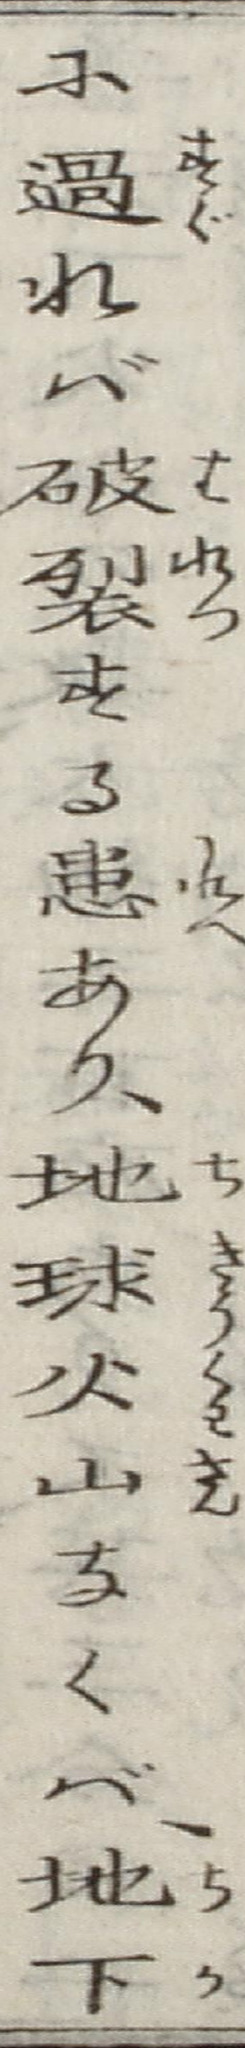に過れば破裂する患あり、地球火山なくば、地下
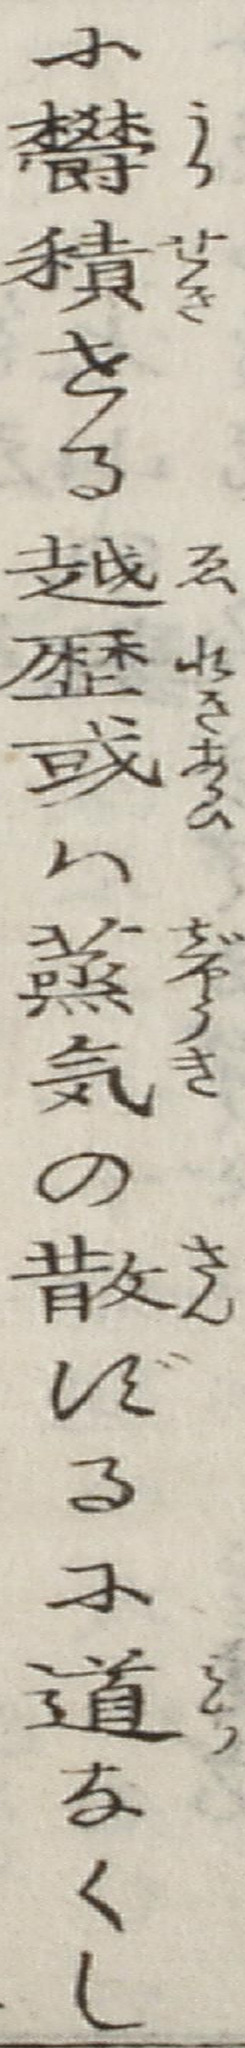に鬱積せる越歴或は蒸気の散ずるに道なくし
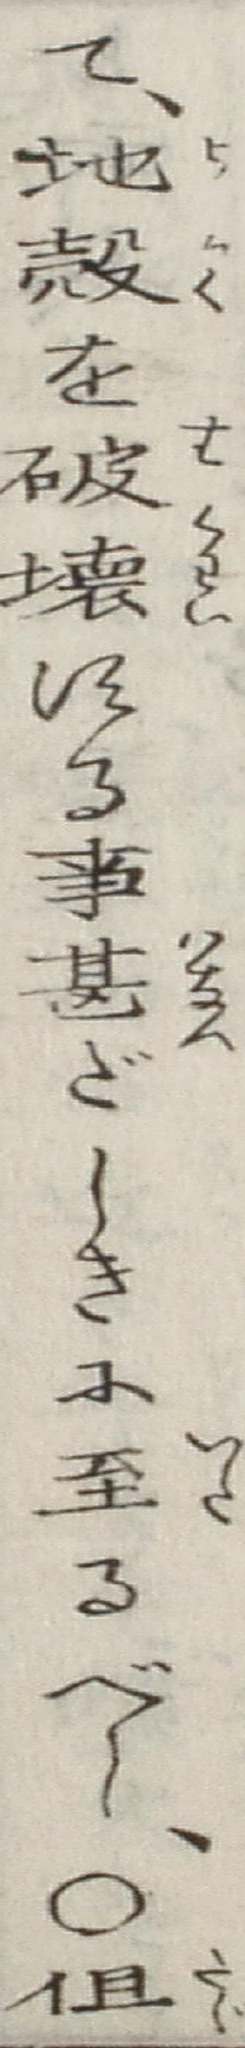て、地殻を破壊する事甚だしきに至るべし、〇但
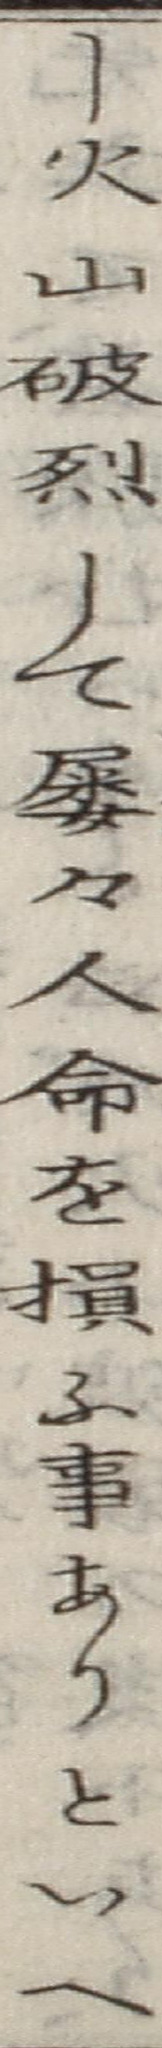し火山破烈して、屡々人命を損ふ事ありといへ
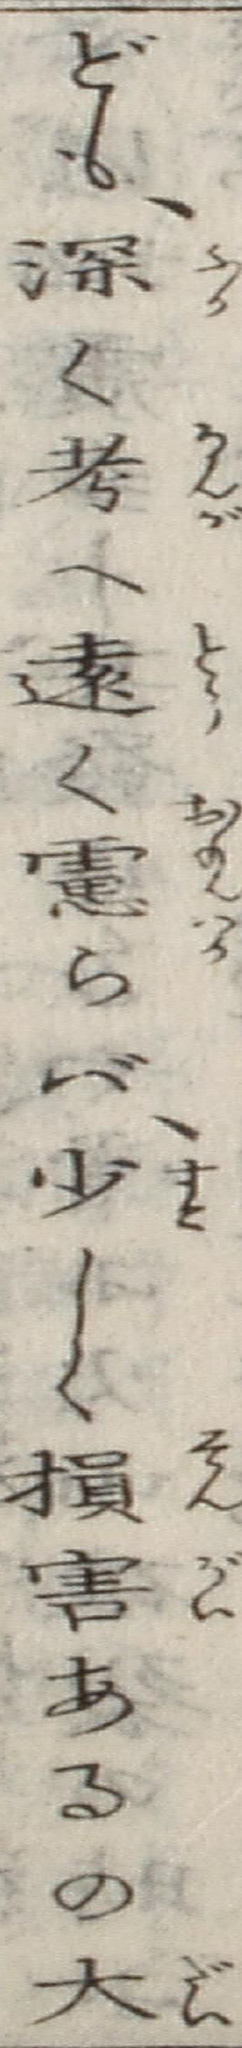ども、深く考へ遠く慮らば、少しく損害あるの大
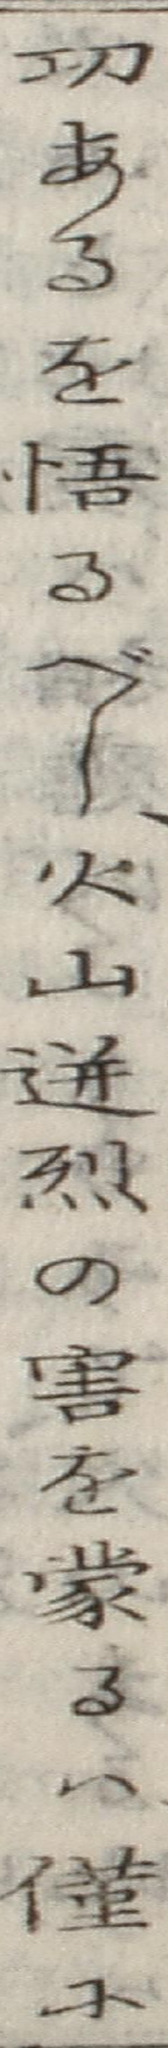功あるを悟るべし、火山迸烈の害を蒙るは、僅に
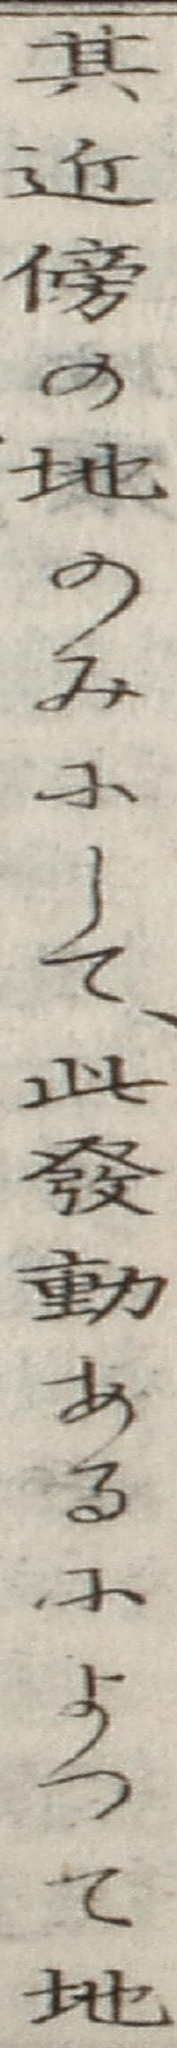其の近傍の地のみにして、此発動あるによって地
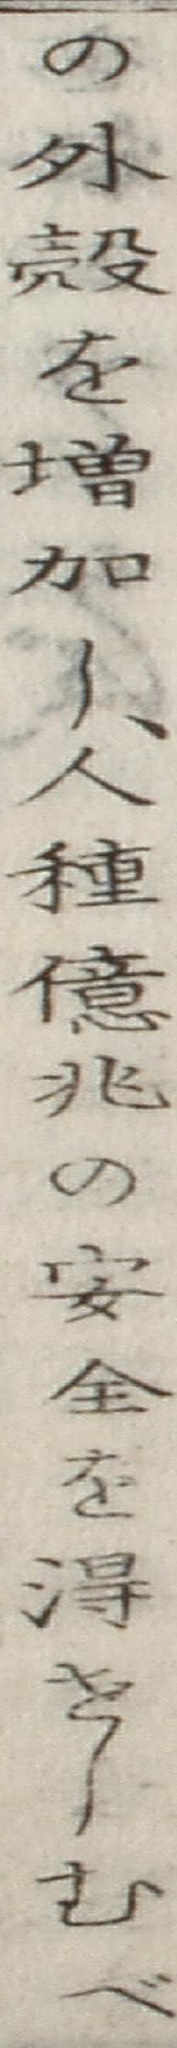の外殻を増加し、人種億兆の安全を得せしむべ
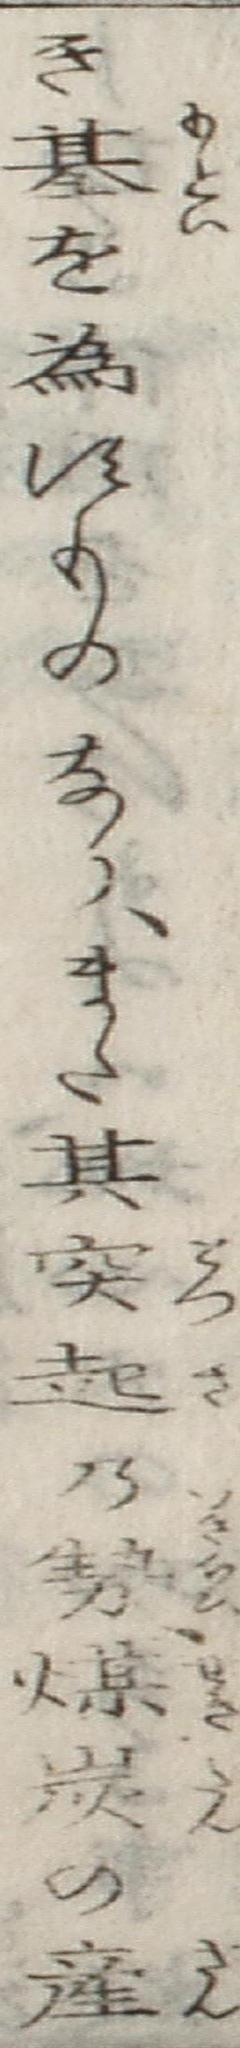き基を為すものなり、また其突起の勢、煤炭の産
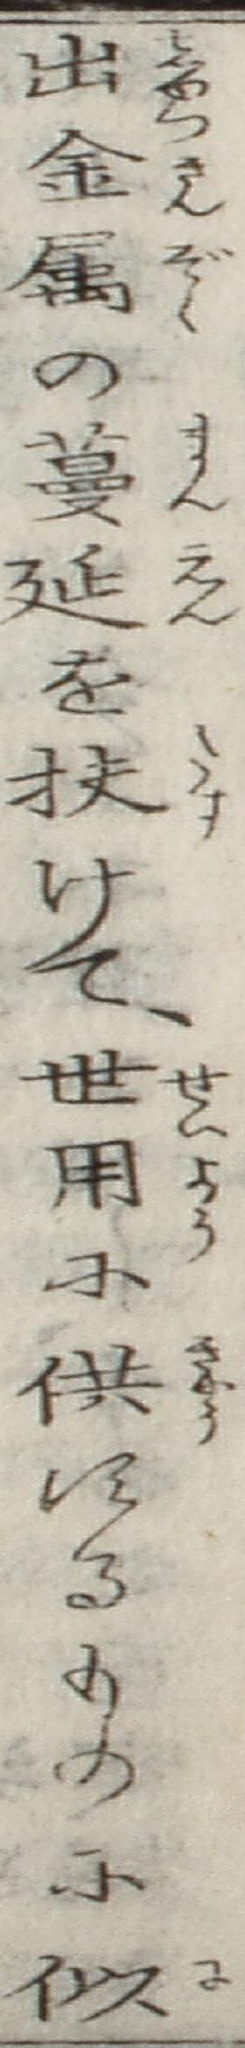出金属の蔓延を扶けて、世用に供するものに似
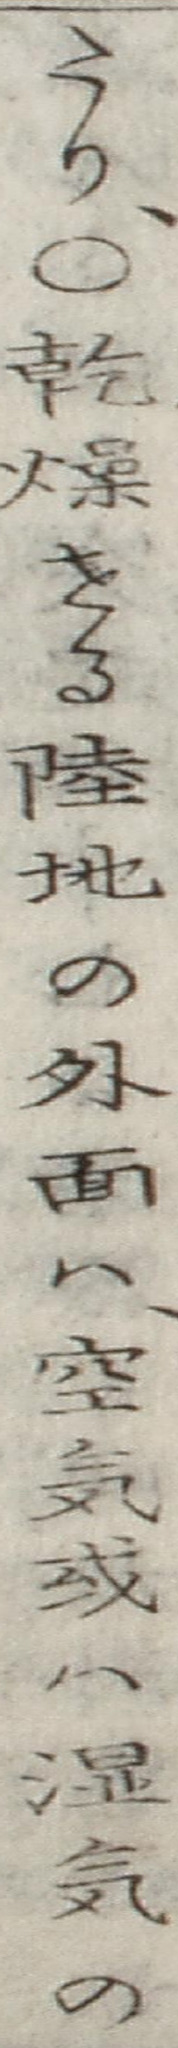たり、〇乾燥せる陸地の外面は、空気或は湿気の
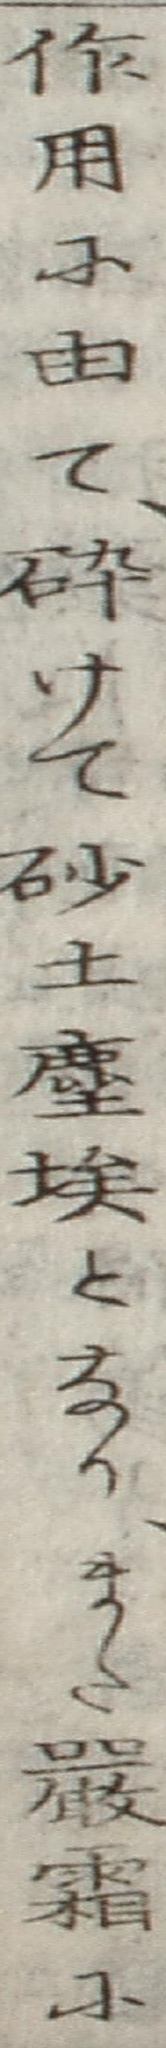作用に由て、砕けて砂土塵埃となり、また厳霜に

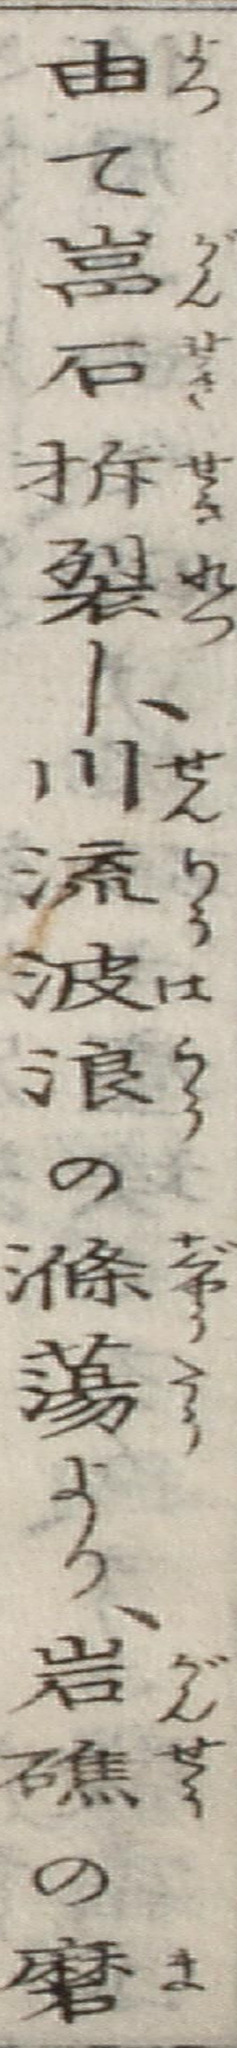由て岩石拆裂し、川流波浪の滌蕩より岩礁の磨
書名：訓蒙　天然地理學　上
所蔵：東京大学地震研究所図書室 Earthquake Research Institute Library, The University of Tokyo, JAPAN
